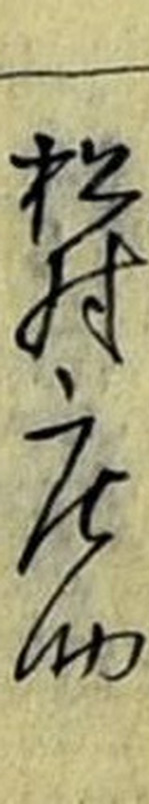松村庄助
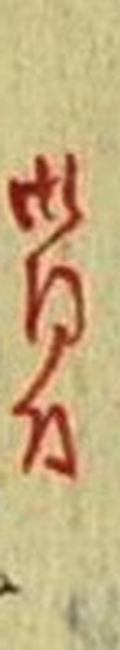御目付
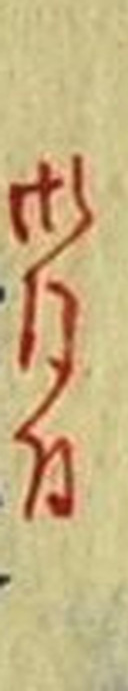御目付
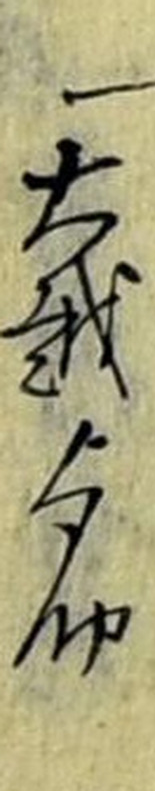大越与助
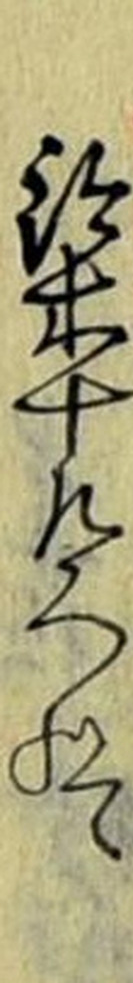鈴木十左衛門組へ

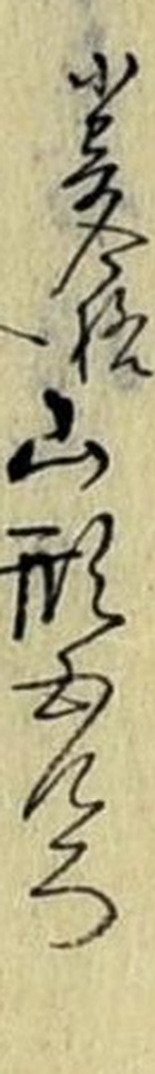小算格山形五左衛門
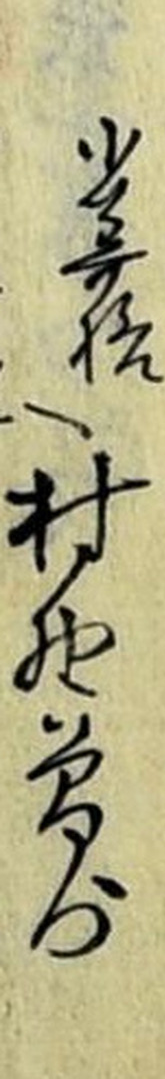小算格村野曽右衛門
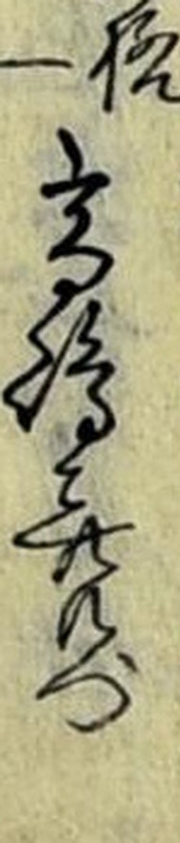林喜左衛門
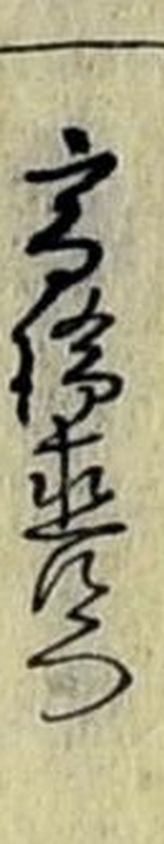高橋直右衛門
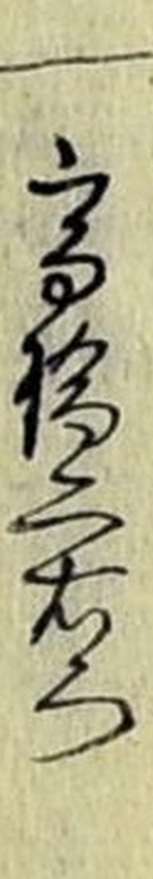高橋二右衛門
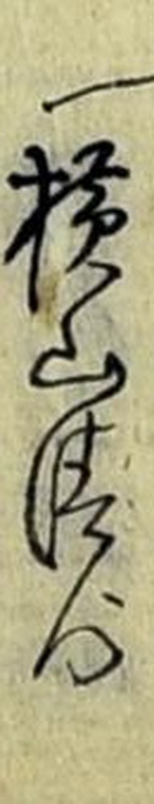横山清右衛門
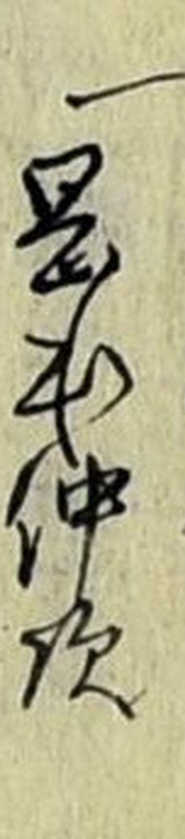岡本仲次
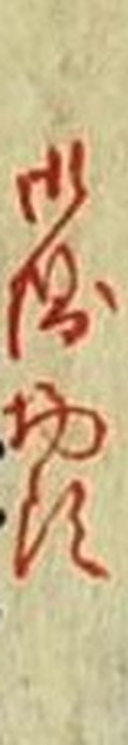御側物頭
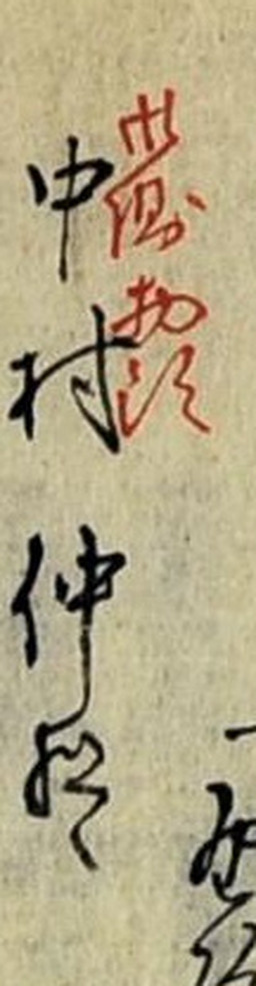中村仲組へ
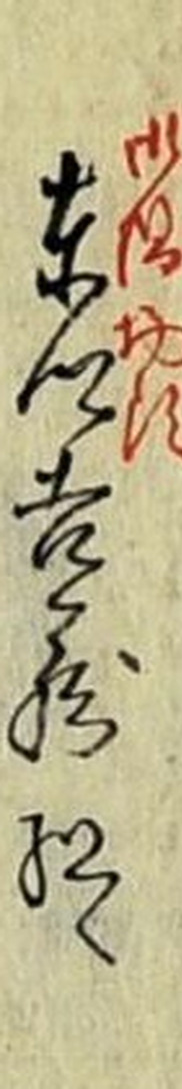東郷吉蔵組へ
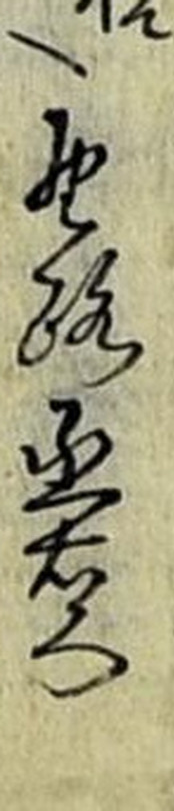高橋直右衛門
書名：命令之部 四
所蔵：福井県文書館 Fukui Prefectural Archives
